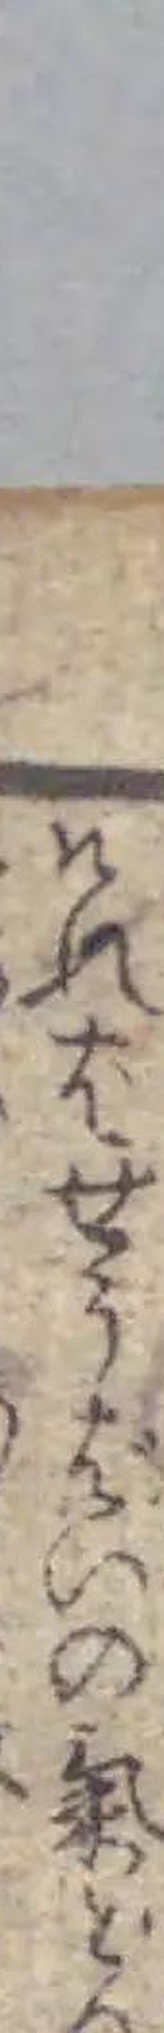けれはせいばいの気どり
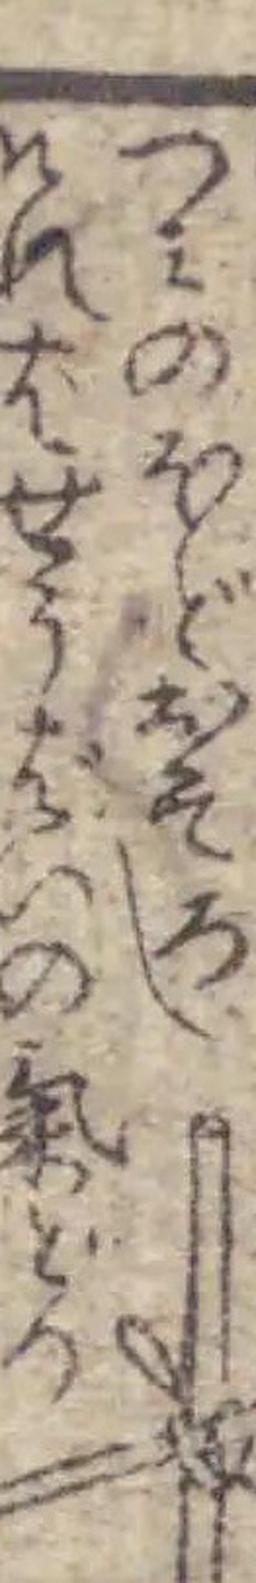けれはせいばいの気どり
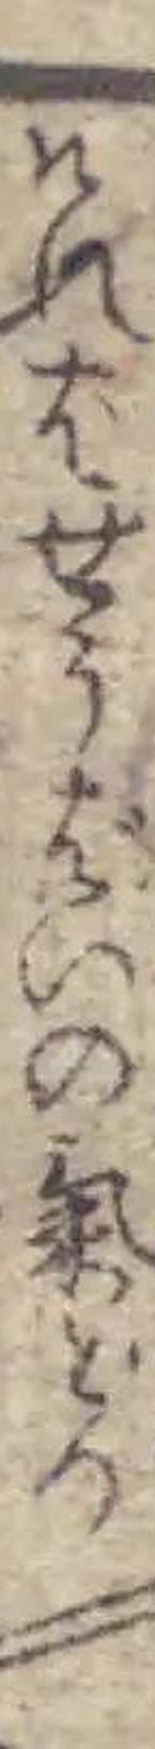けれはせいばいの気どり
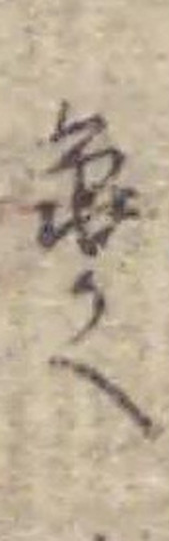亀かへ
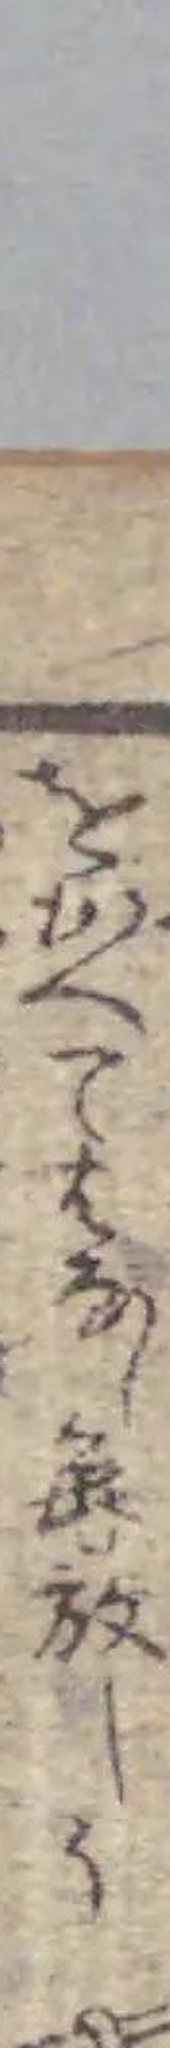をかへてはなし亀放しう
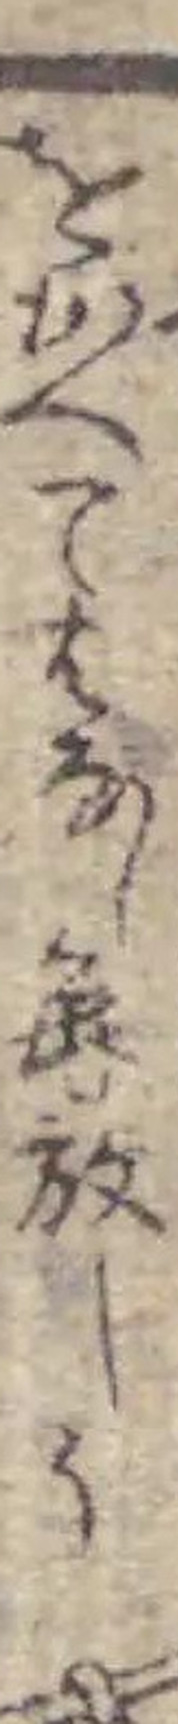をかへてはなし亀放しう
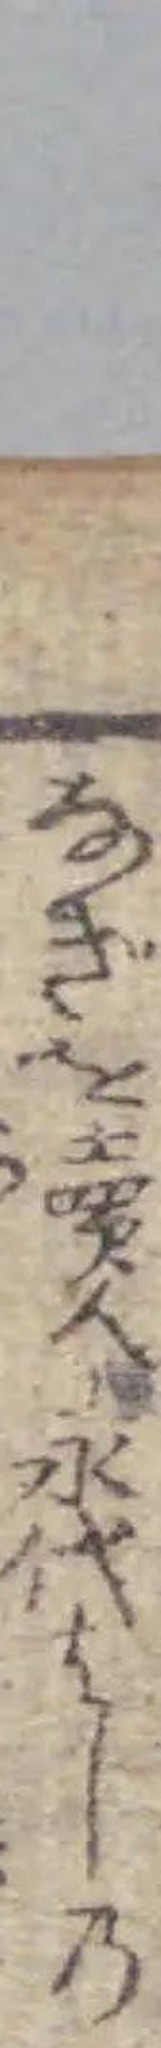なぎを買て永代はしの
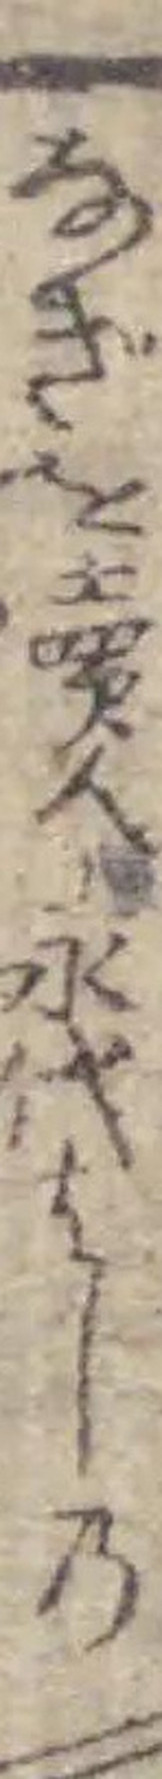なぎを買て永代はしの
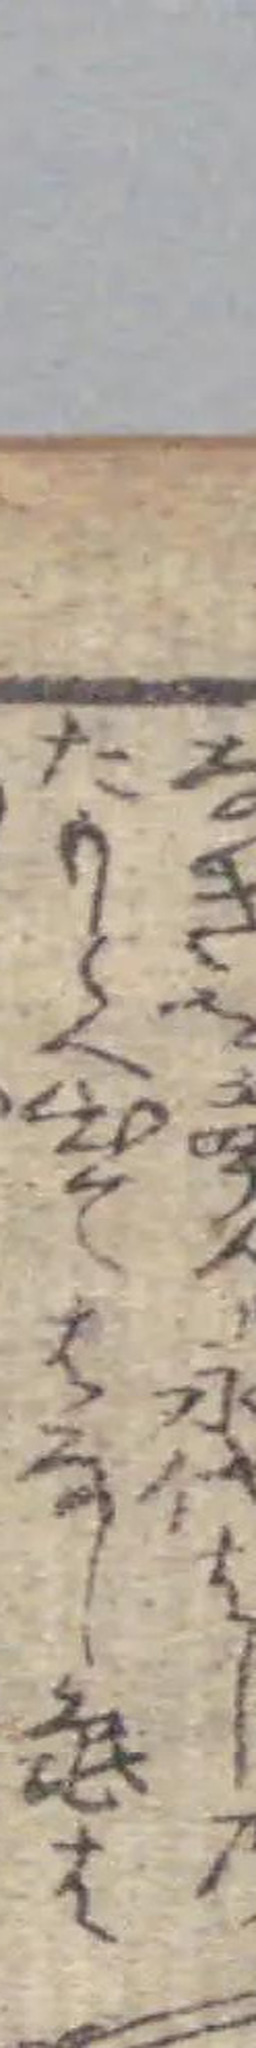たもとへ出てはなし亀は
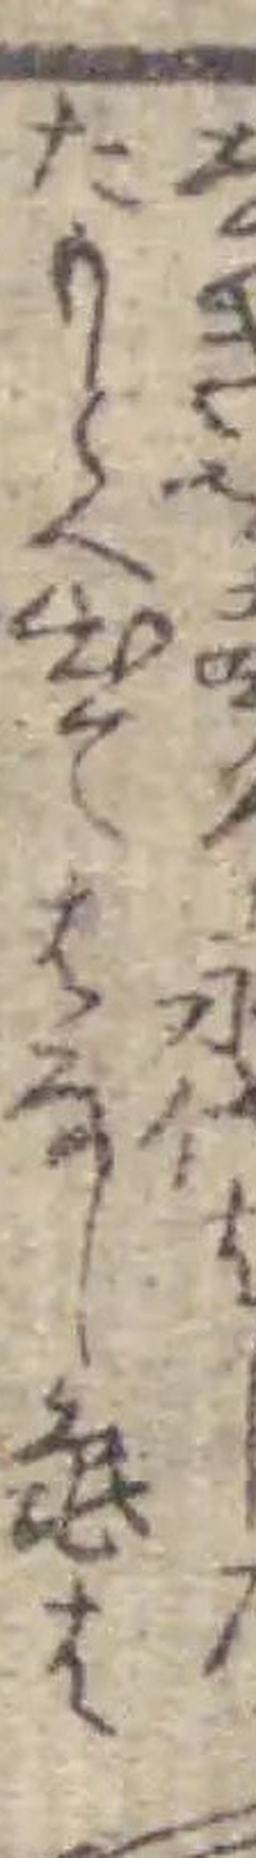たもとへ出てはなし亀は
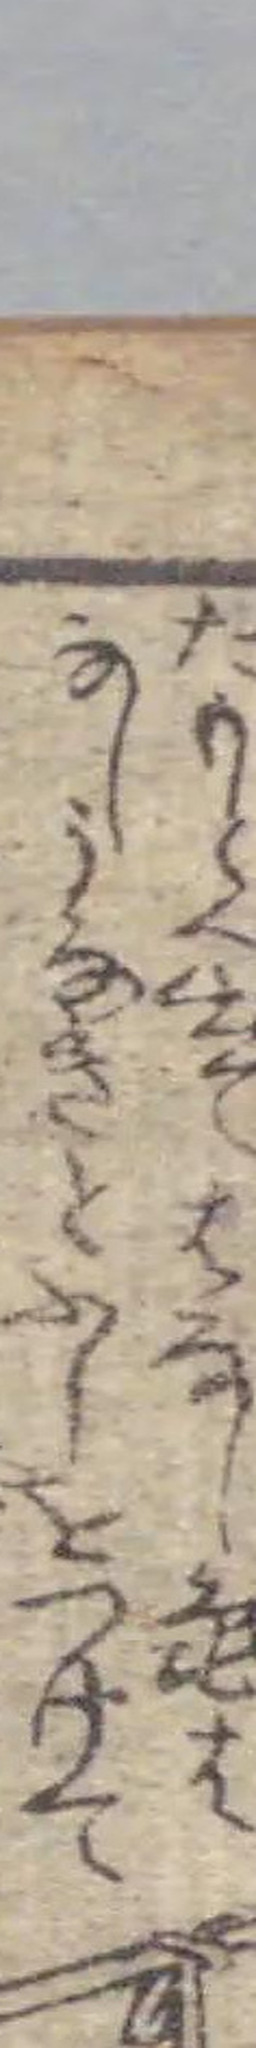なしうなきとふしをつけて
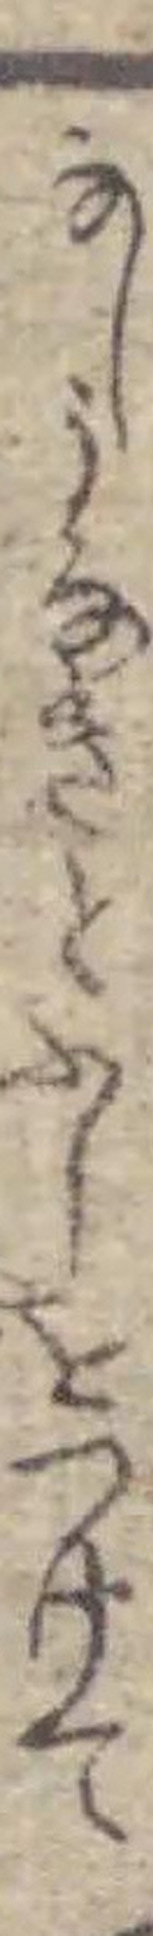なしうなきとふしをつけて
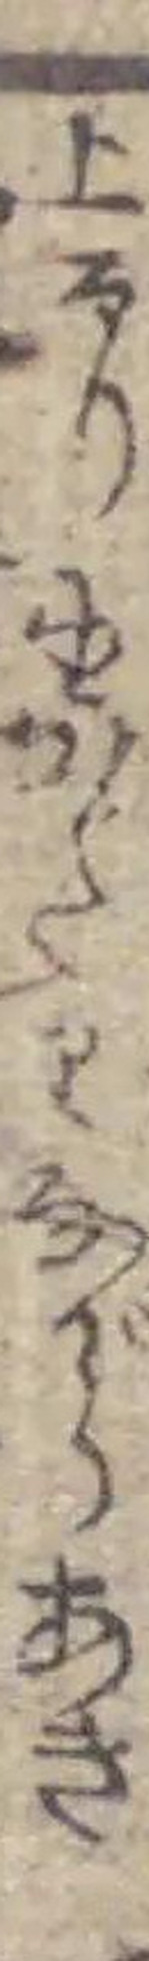上るりにかたりながらあき
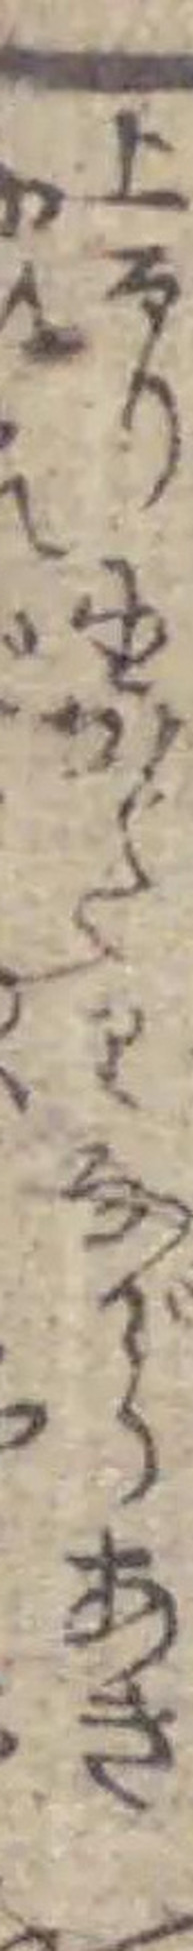上るりにかたりながらあき
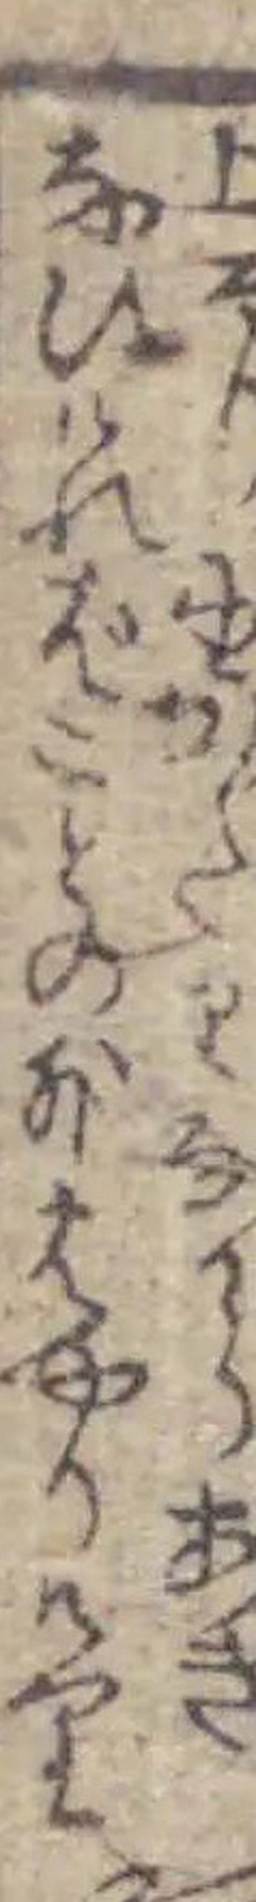なひければことの外はやりけり

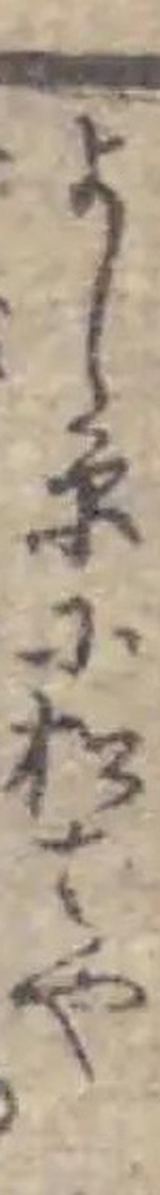よし原に松はや
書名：見立蓬莱 : 2巻
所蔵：国立国会図書館 National Diet Library, JAPAN
